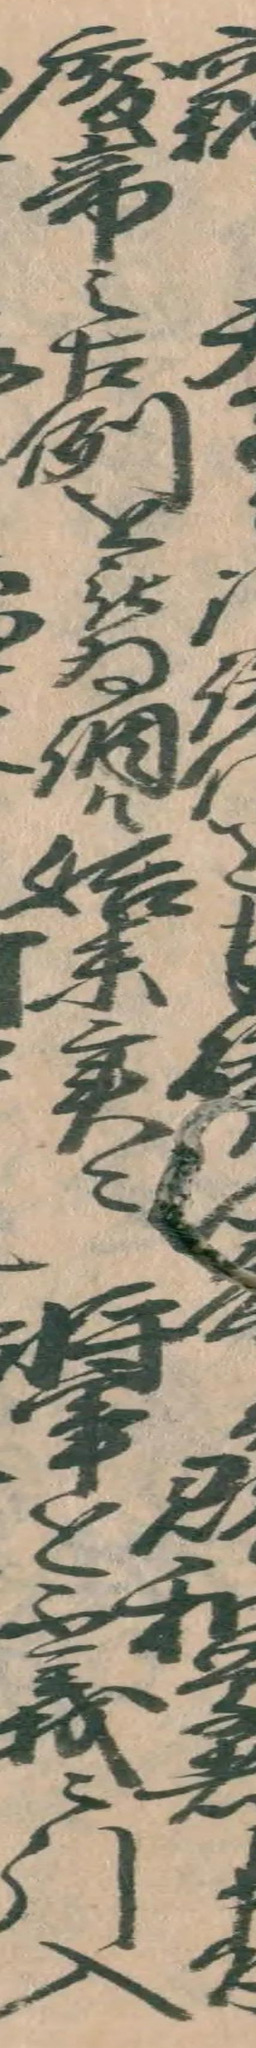廃帝之古例を被為調候始末実ニ将軍を不義ニ引入
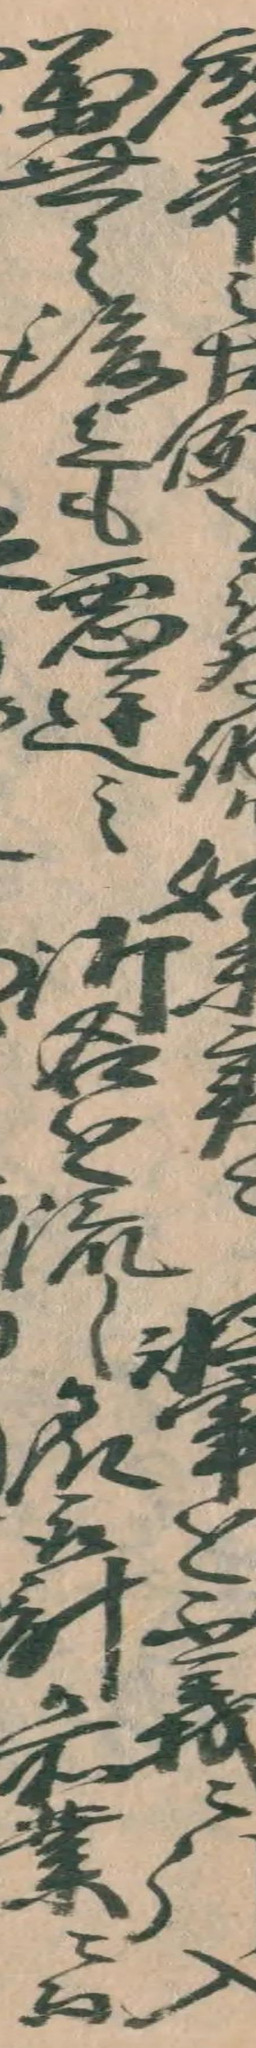萬世之後迄も悪逆之御名を流し候様取計候所業ニ而
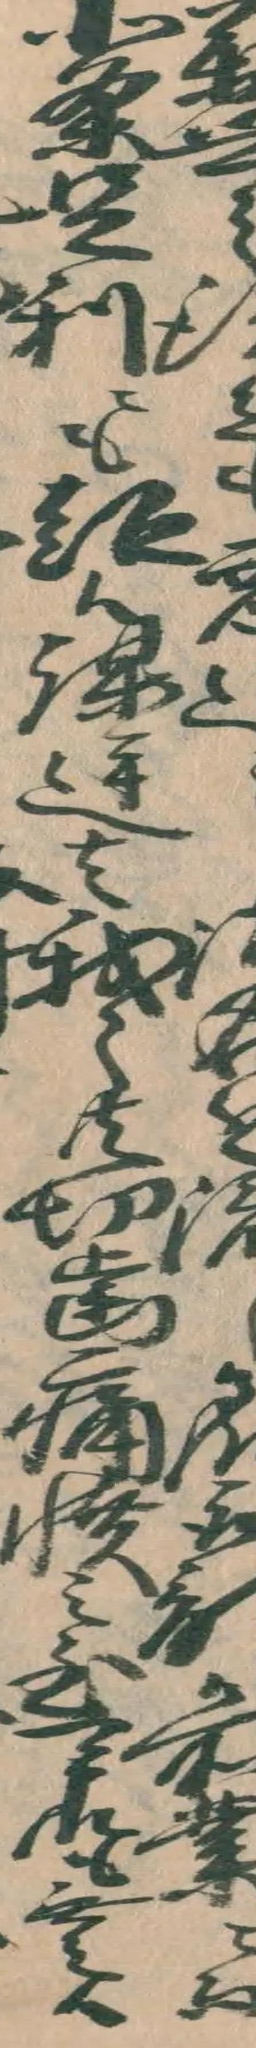北条足利ニも超ん謀逆者我々共切歯痛憤之至可申様も無之候
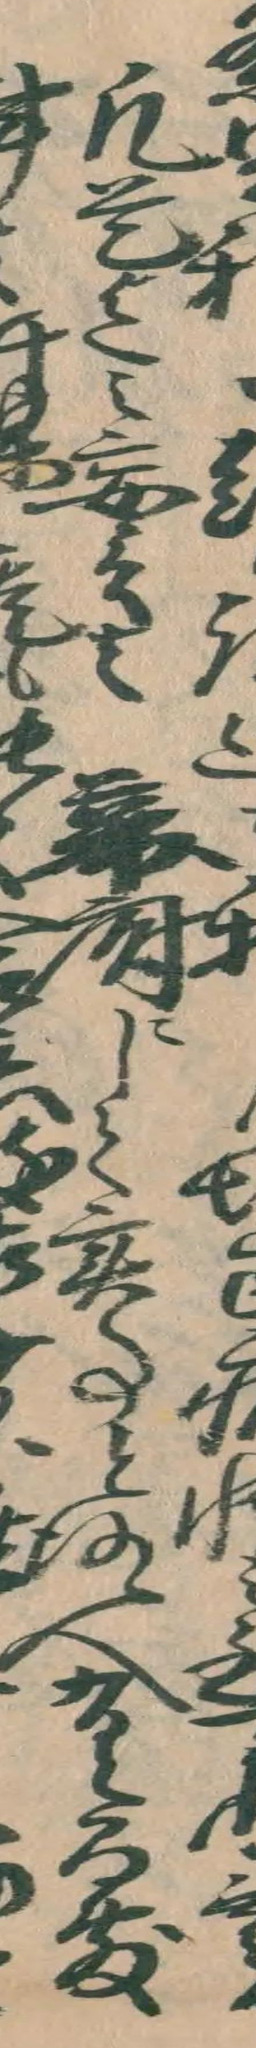凡是迄之妄言者幕府にして実事と存候人有之間敷
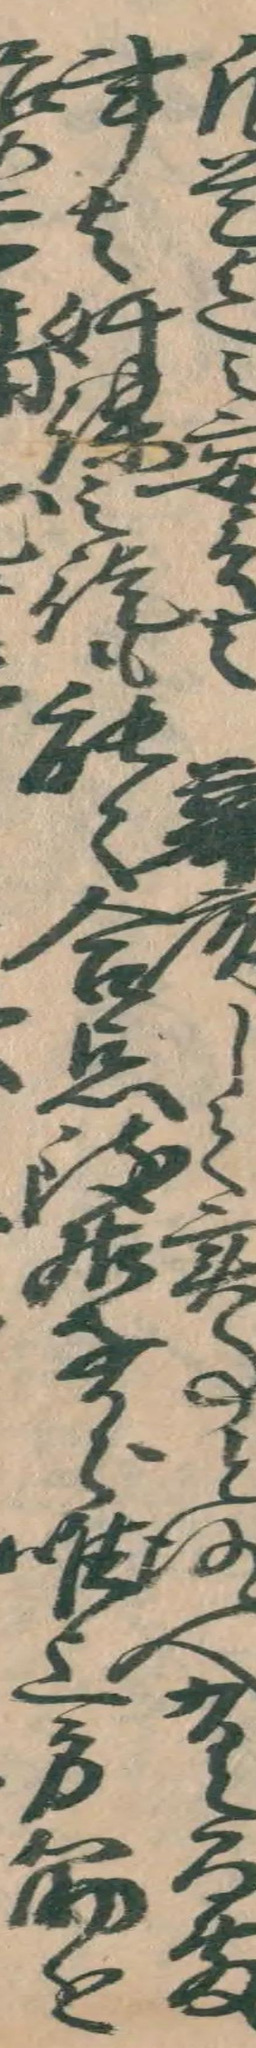事者奸謀之徒も能々合点致居なから唯上方筋を
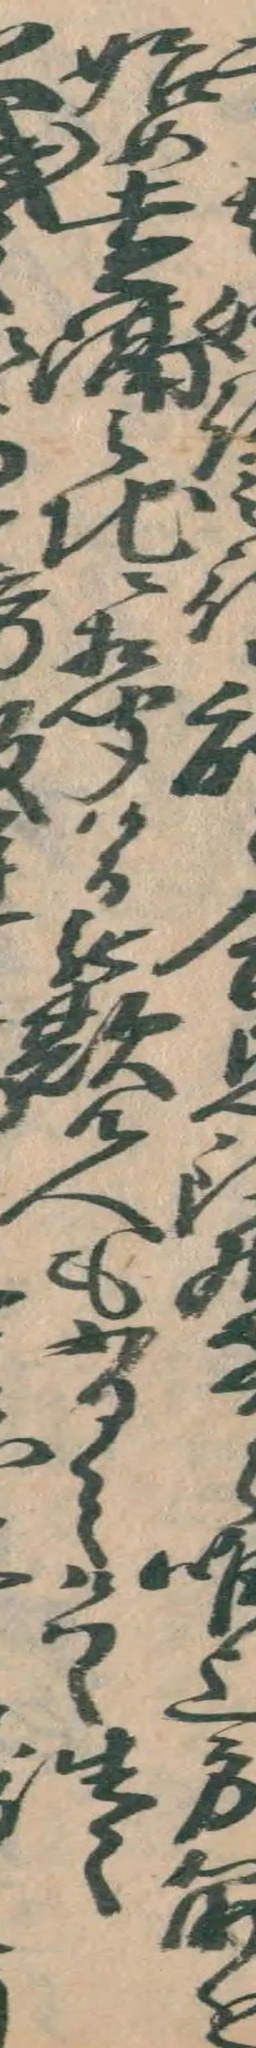始め遠隔之地ニ相聞候而被欺候人も有之候ハヽ往々
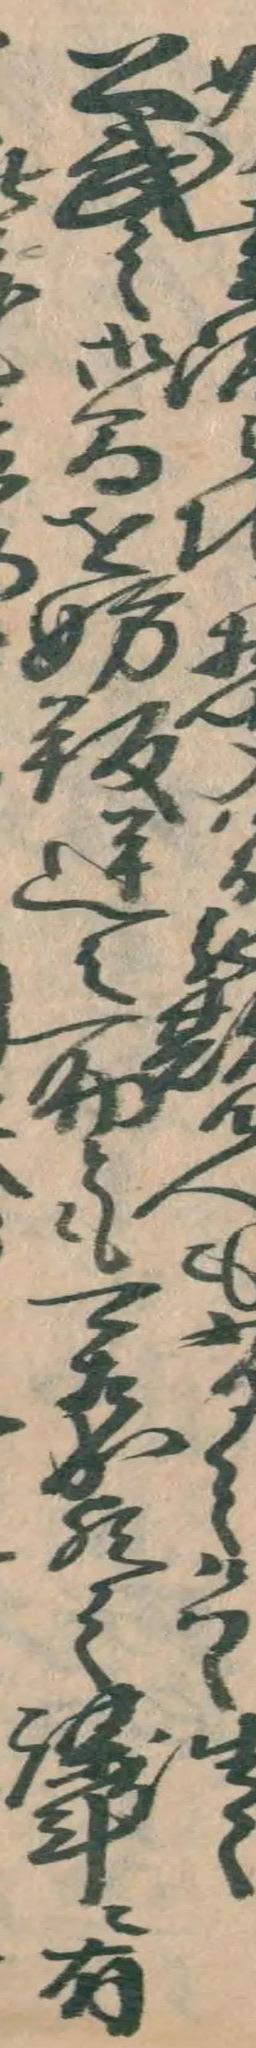公武之間を妨叛逆之一助とも可相成欤之謀斗ニ有
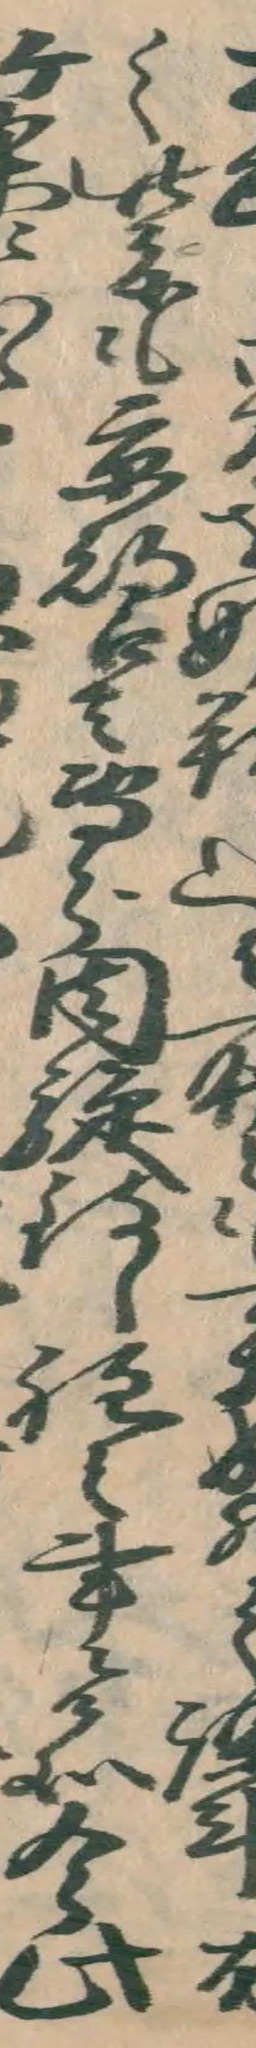之此度も京都江者専ら周旋致候程之事ニ候処今此
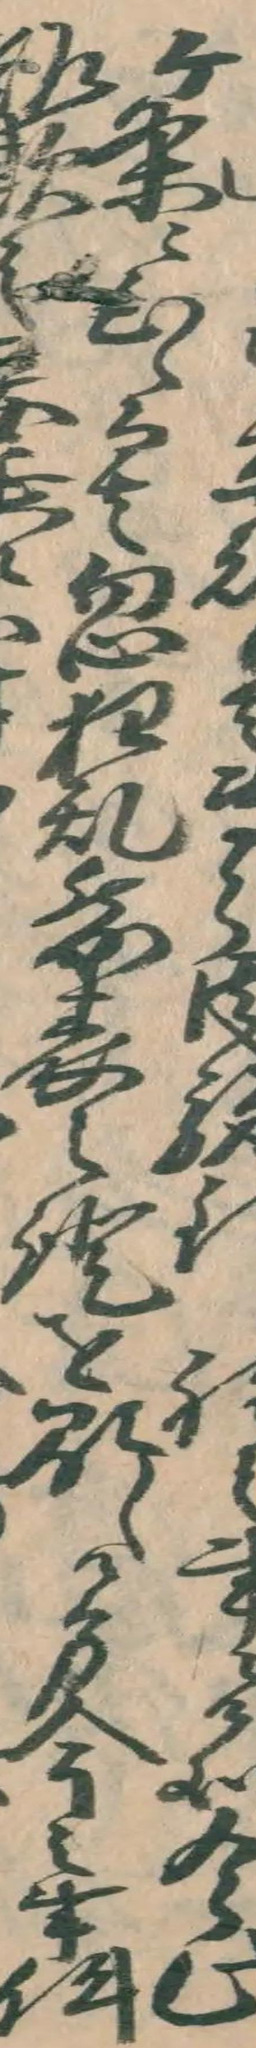ケ条ニ至候而者忽狂乱発表之證を顕し候方今之事件
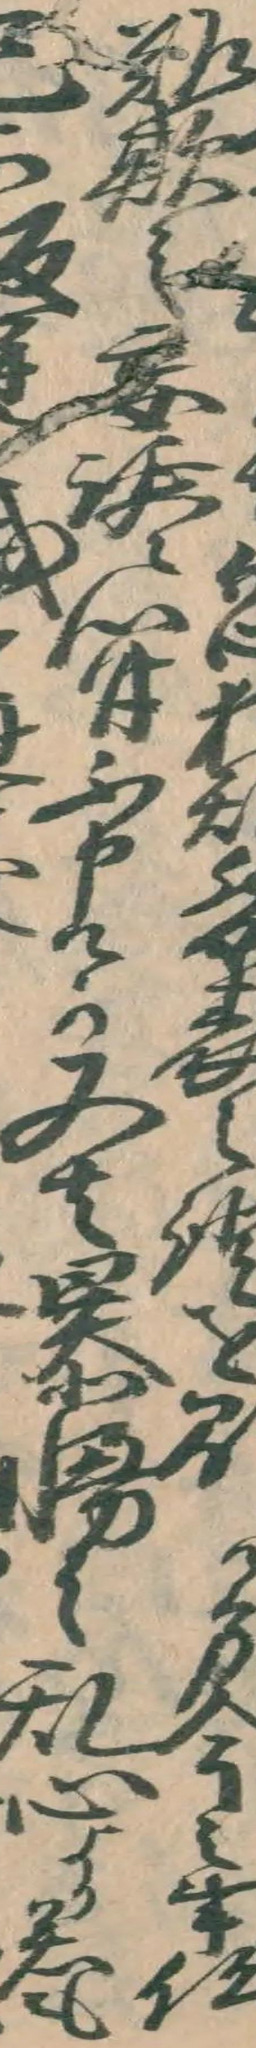難欺之妄誕ニ心付不申候か又者暴慢之乱心より若も
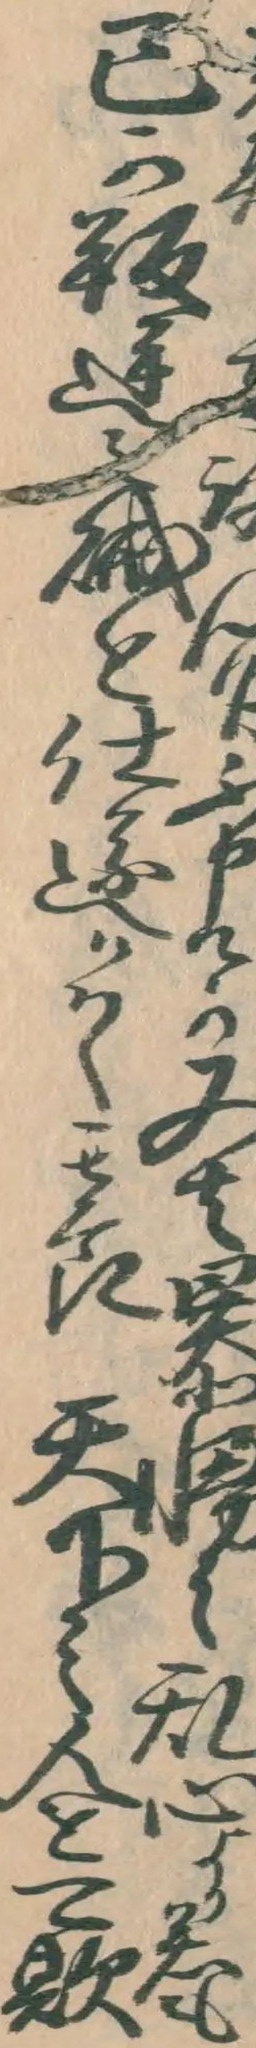己か叛逆之賊を仕遂候ハヽ其節天下之人を可欺

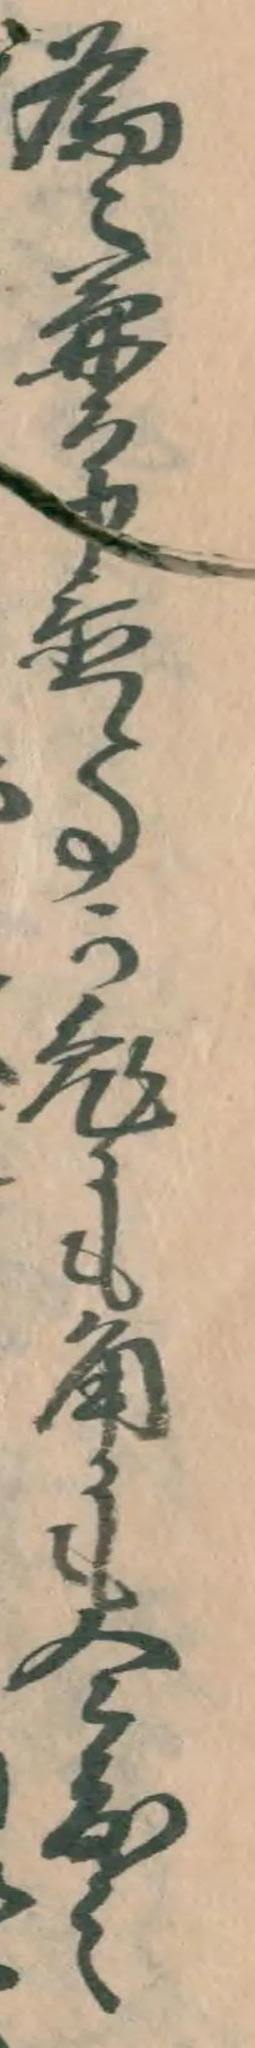為ニ兼而申置候事か兎にも角にも今度之
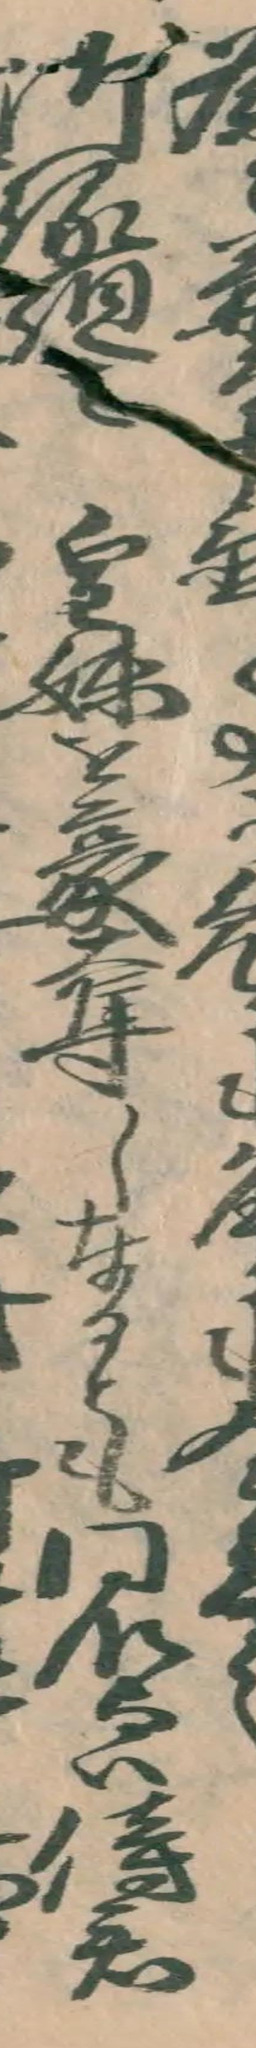御縁組者皇妹を豪奪し奉るとも同様とハ侍君
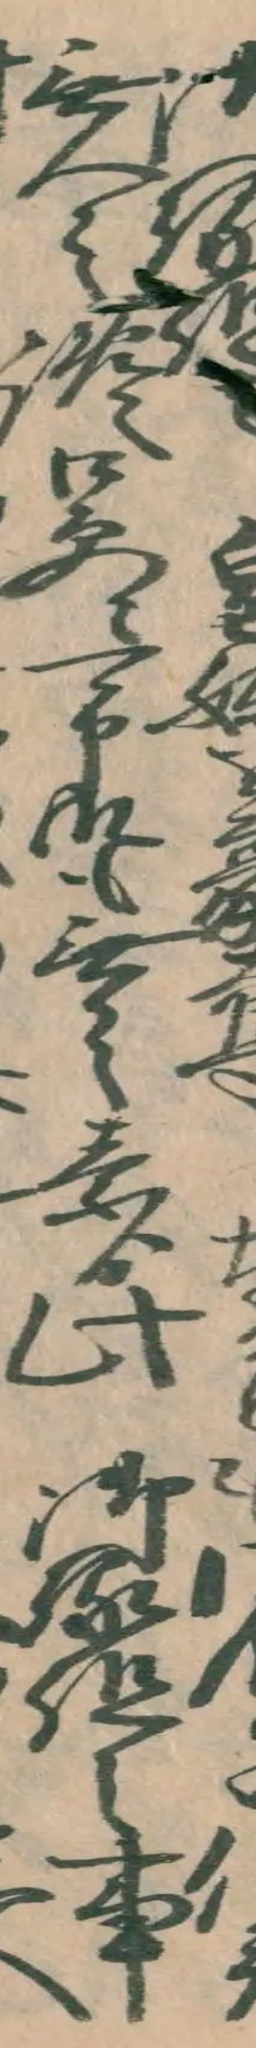無人之讒口更ニ可申様も無之素ゟ此御縁組之事
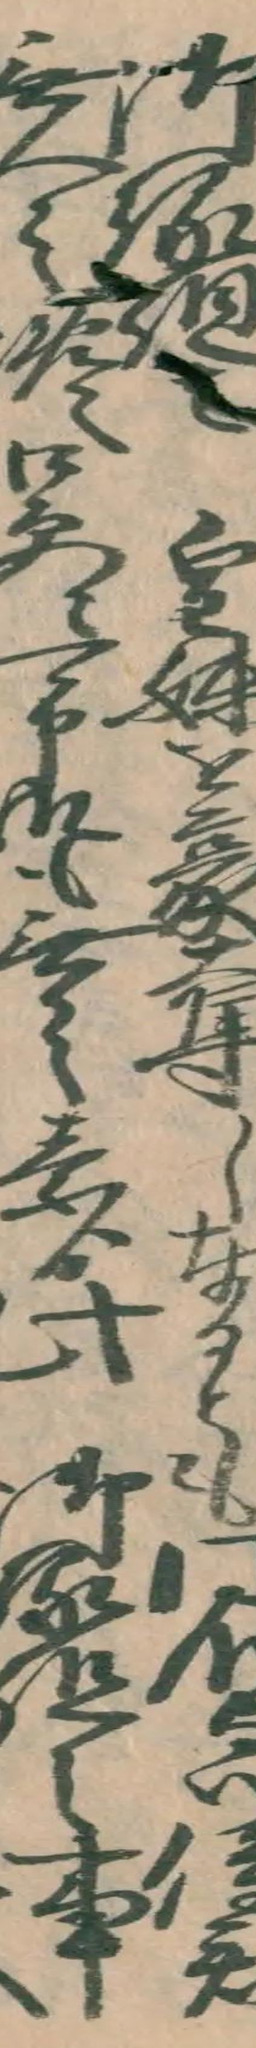無人之讒口更ニ可申様も無之素ゟ此御縁組之事
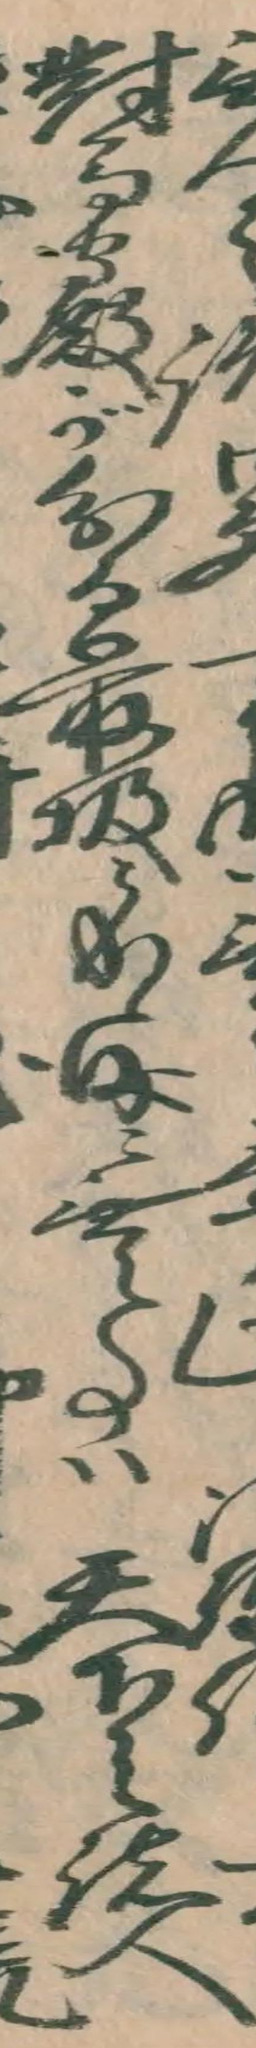對馬守殿が分而御取扱被成候儀ニ無之事ハ天下之諸人
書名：麗斎叢書. 20
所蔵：国立国会図書館 National Diet Library, JAPAN
